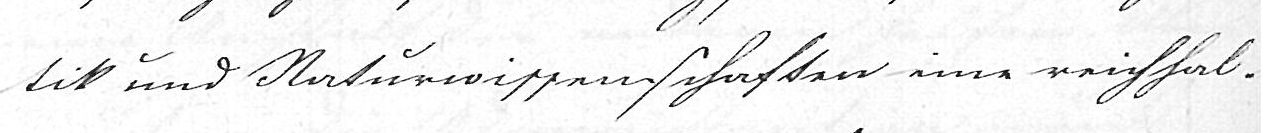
tik und Naturwissenschaften eine reichhal-
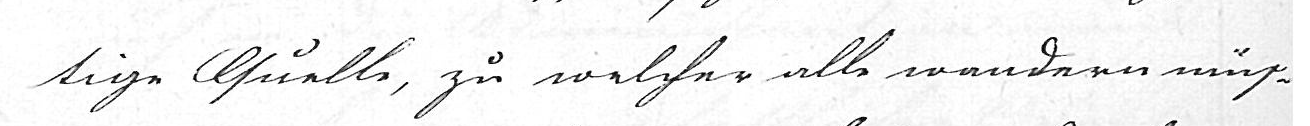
tige Quelle, zu welcher alle wandern müs-
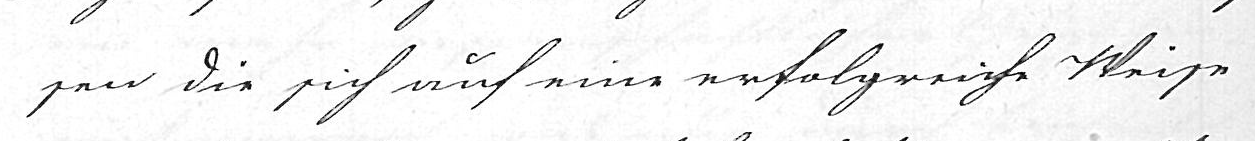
sen die sich auf eine erfolgreiche Weise
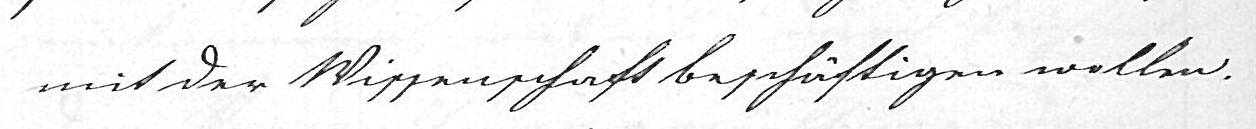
mit der Wissenschaft beschäftigen wollen.
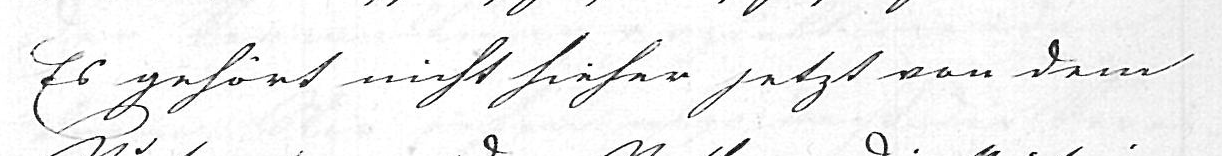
Es gehört nicht hieher jetzt von dem
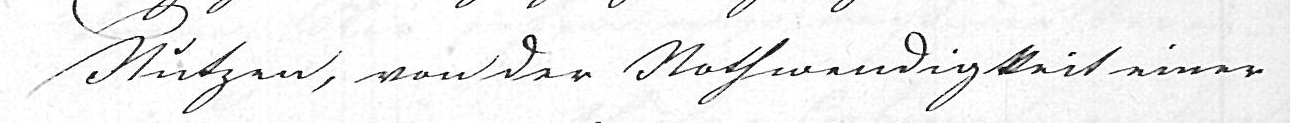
Nutzen, von der Nothwendigkeit einer
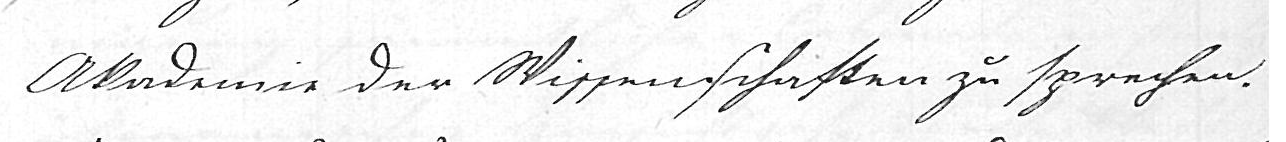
Akademie der Wissenschaften zu sprechen.
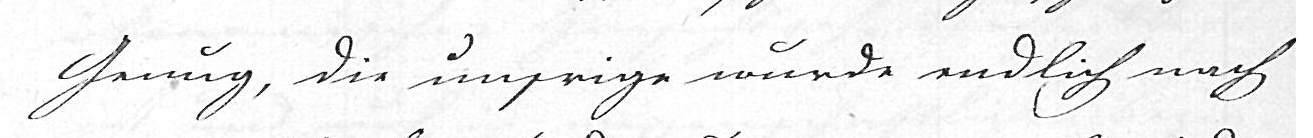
Genug, die unsrige wurde endlich nach
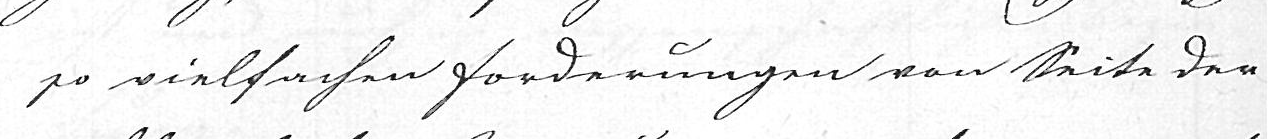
so vielfachen Forderungen von Seite der
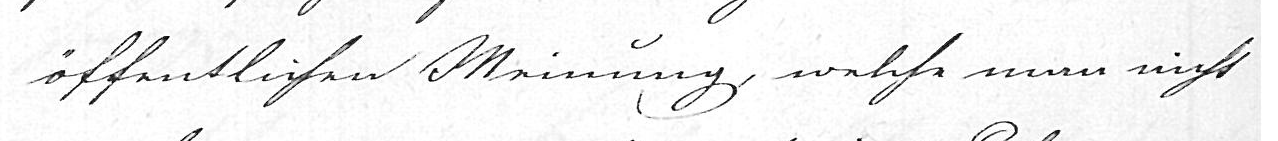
öffentlichen Meinung, welche man nicht
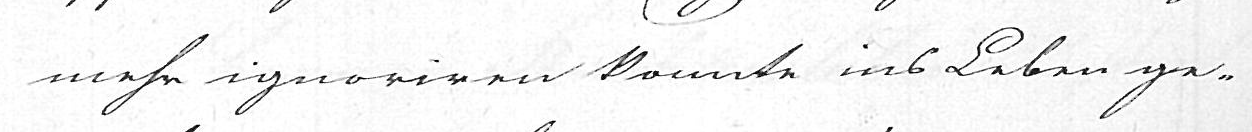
mehr ignoriren konnte ins Leben ge-
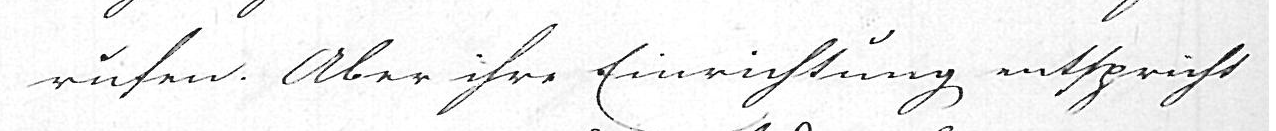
rufen. Aber ihre Einrichtung entspricht
